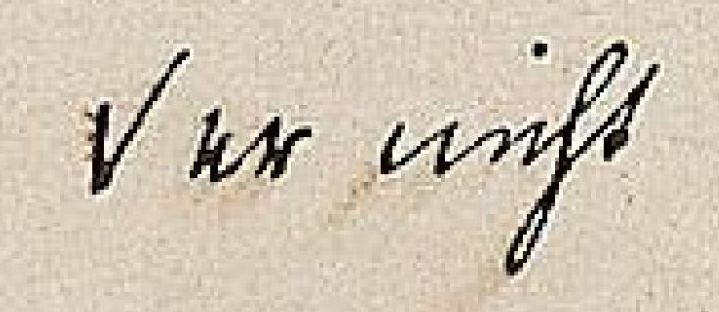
V er nicht
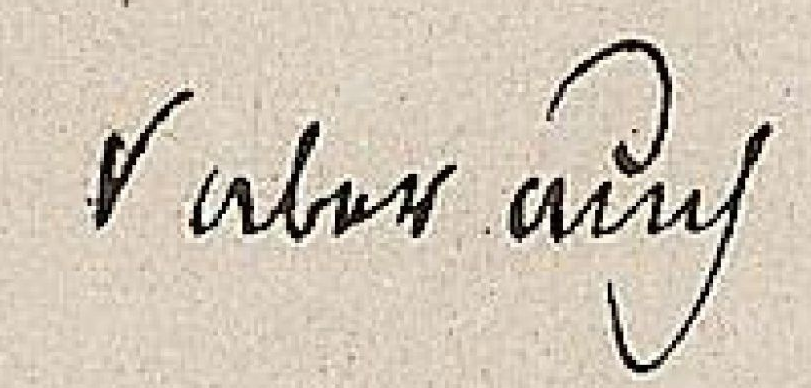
V aber auch
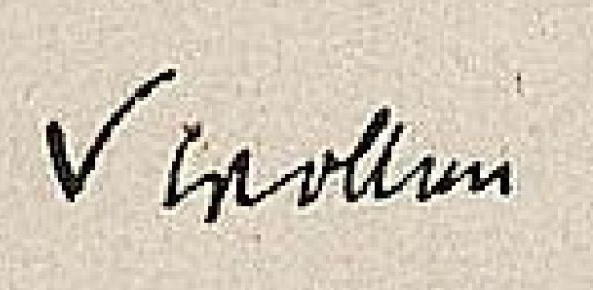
V wollen
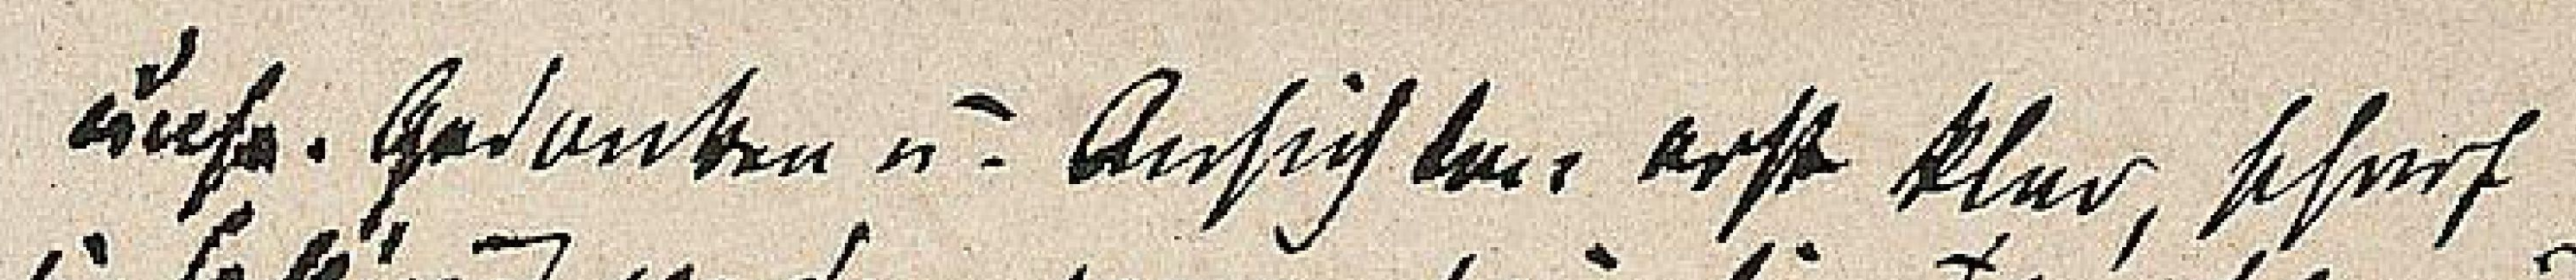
unsr. Gedanken u. Ansichten erst klar, scharf
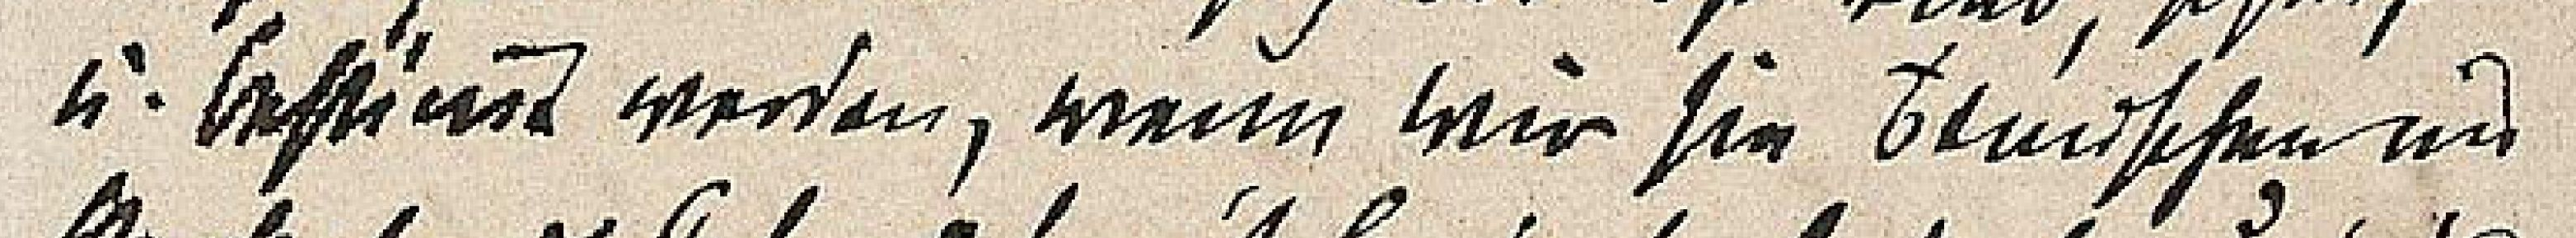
u. bestimmt werden, wenn wir sie stauschen ein
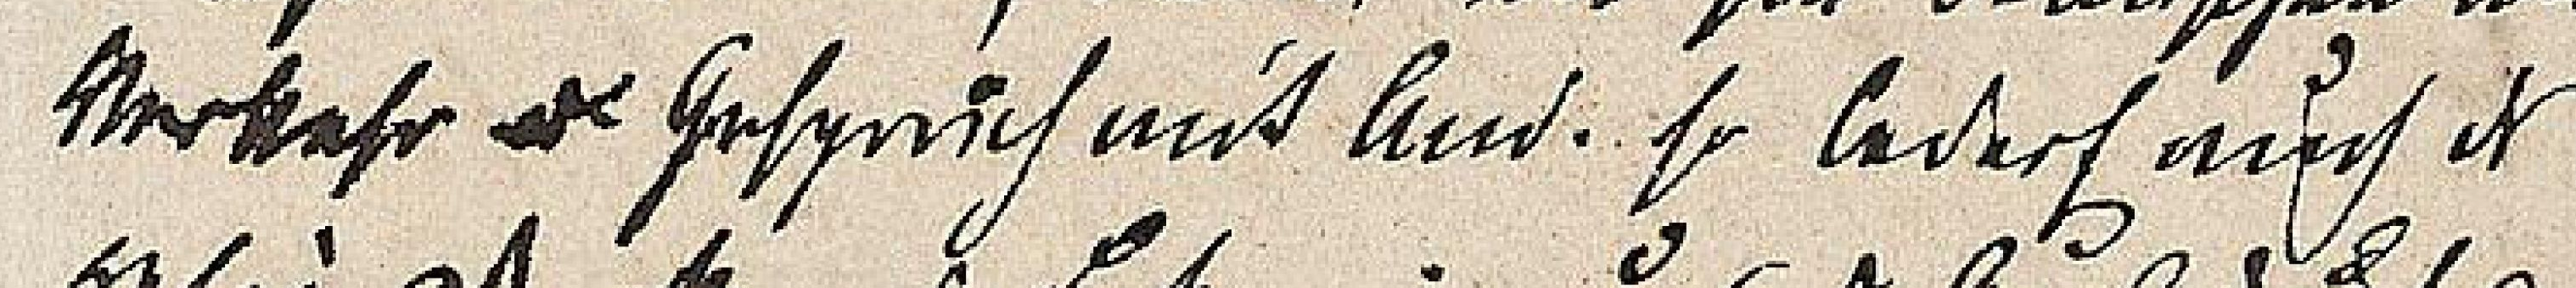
Vorkehr u. Gespräch mit And. so bedarf auch ds
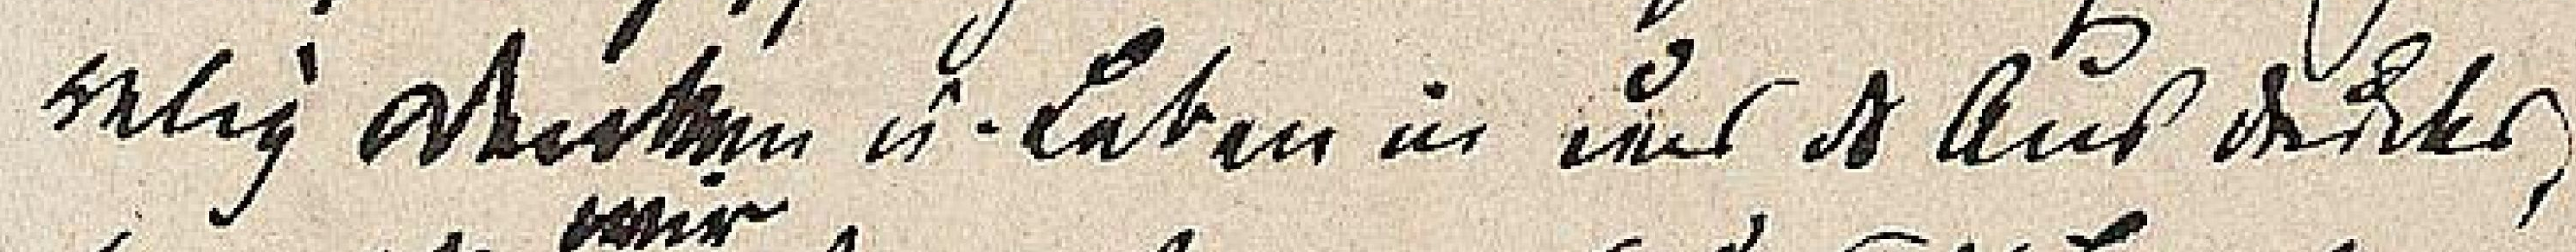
relig Denken u. Leben in uns ds Ausdrucks
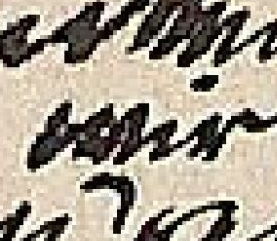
wir
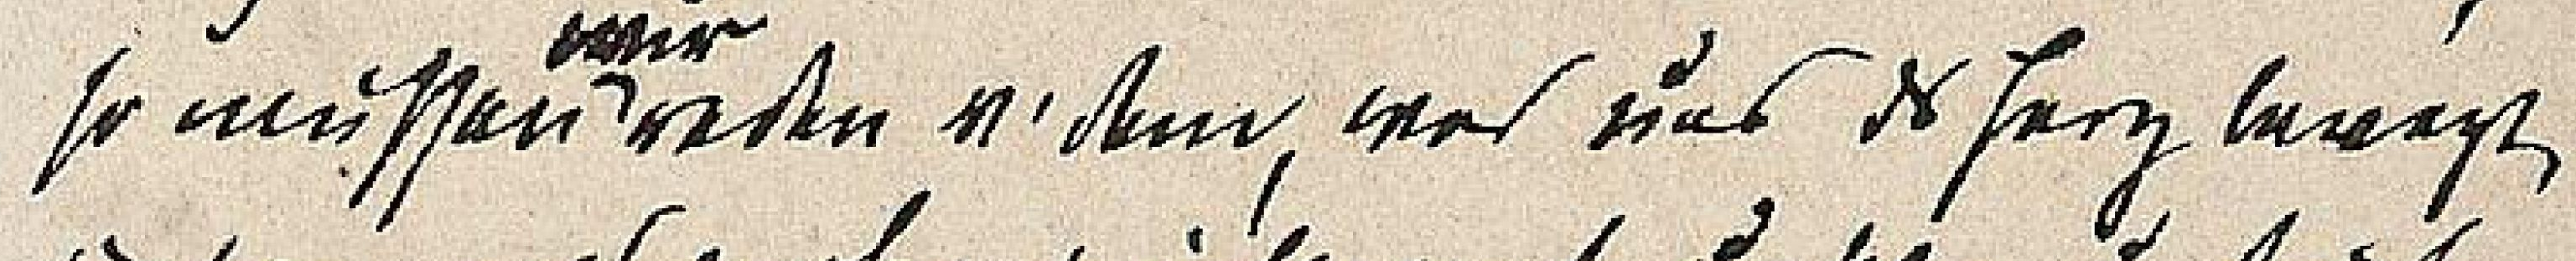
so müssen reden v. dem, was uns das Herz bewegt,
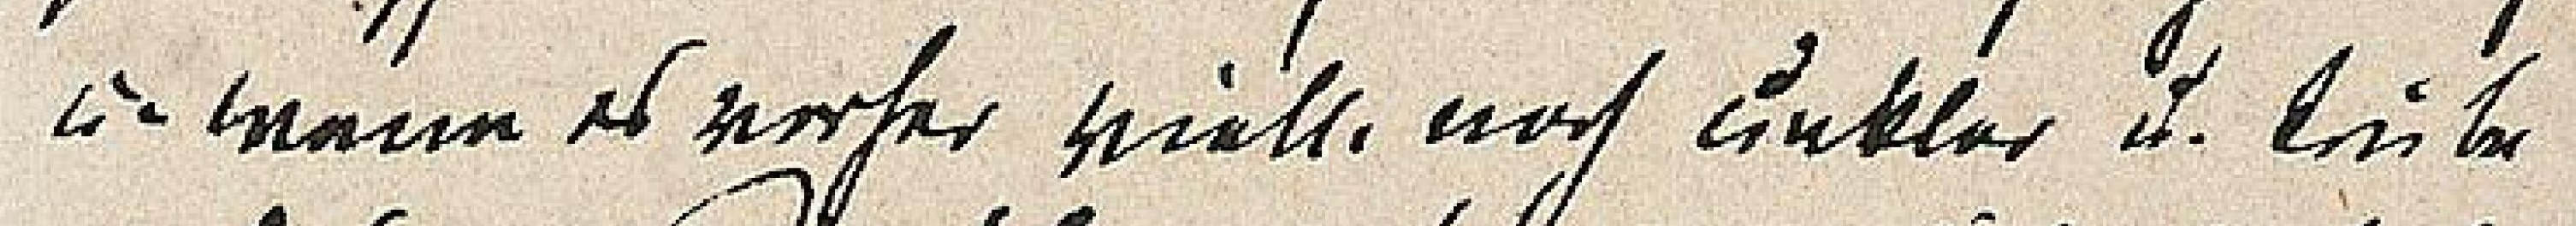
u. wenn es vorher viell. noch unklar u. trübe
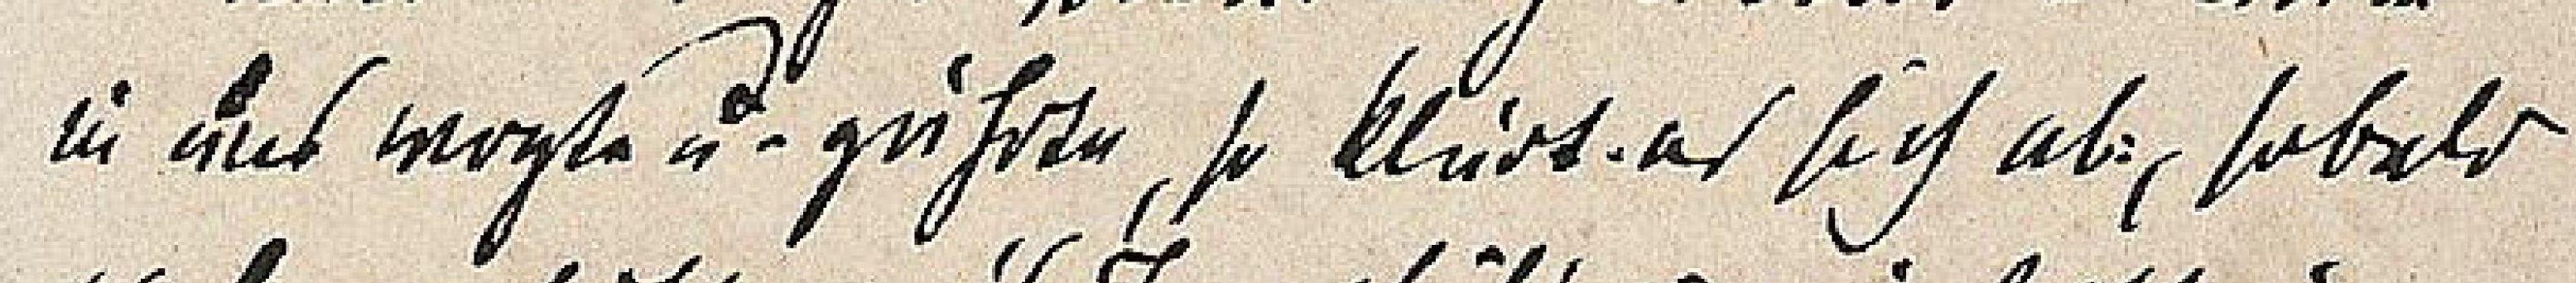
in uns wogte u. gährte, so klärt es sich ab., sobald
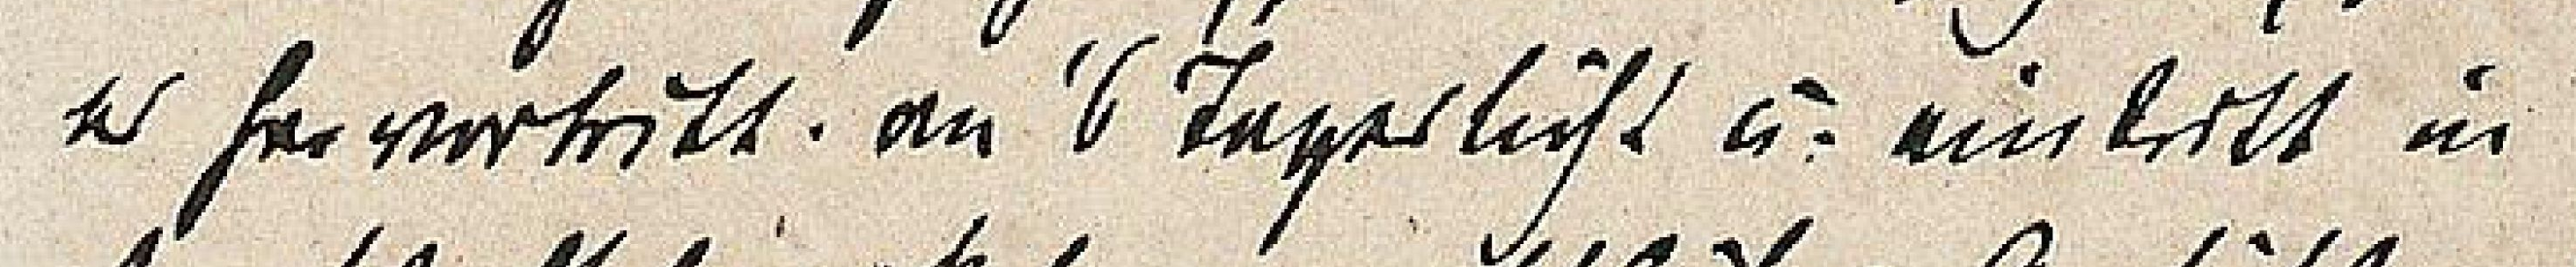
es hervortritt. an's Tageslicht u. eintritt in
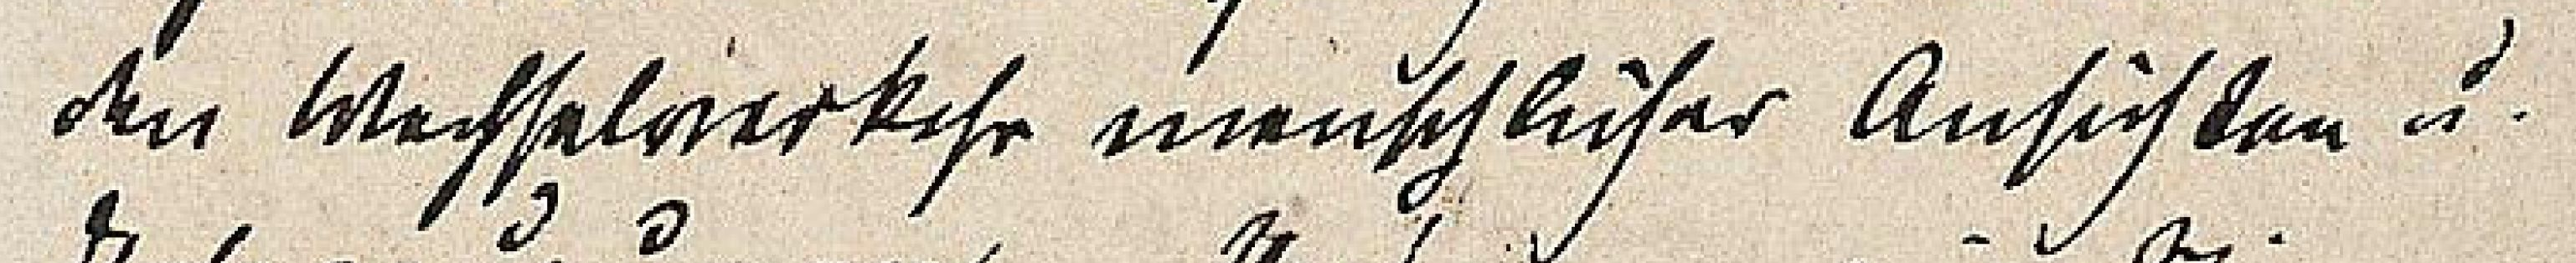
den Wechselverkehr menschlicher Ansichten u.
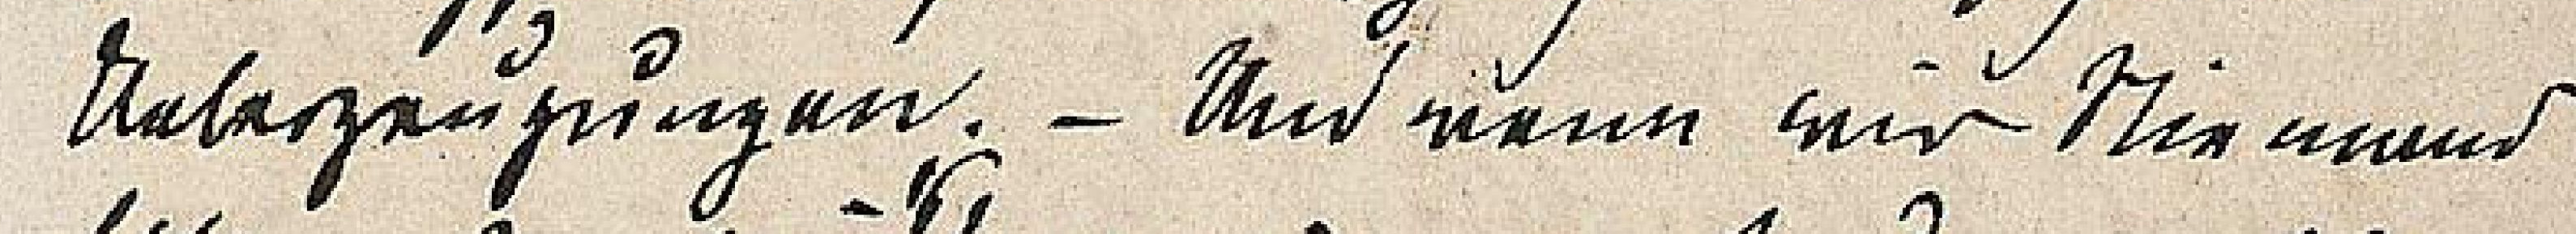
Ueberzeugungen. _ Und wenn wir Niemand
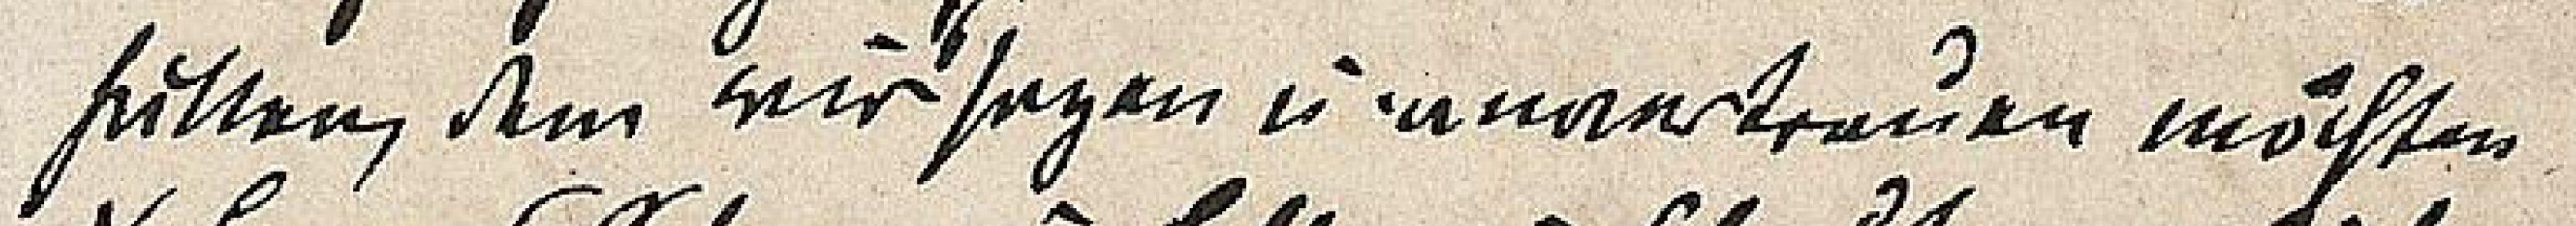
hätten, dem wir sagen u anvertrauen möchten
